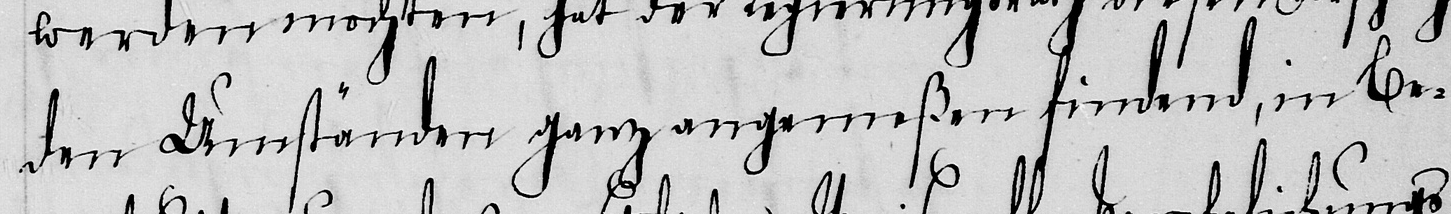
den Umständen ganz angemeßen findend, in Be¬
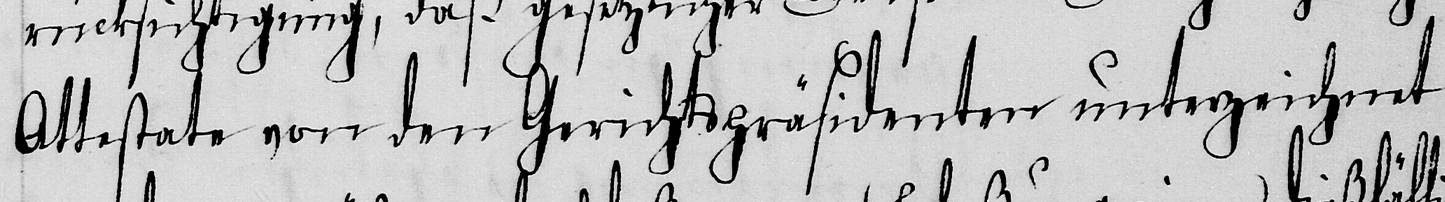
ttestate von den Gerichtspräsidenten unterzeichnet
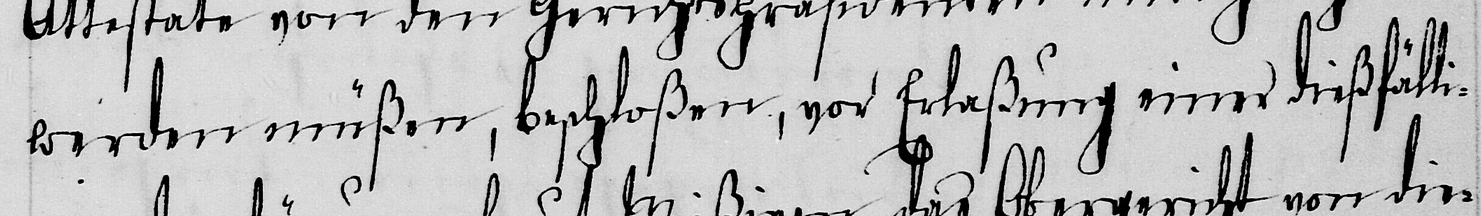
werden müßen, beschloßen, vor Erlaßung einer dießfälli¬
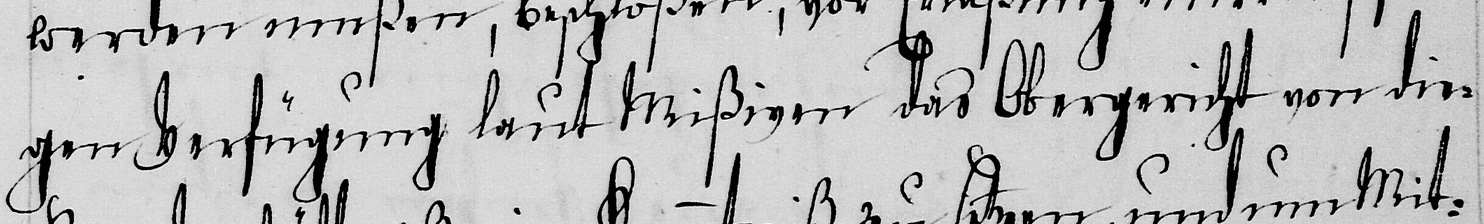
gen Verfügung laut Mißiven das Obergericht von die¬
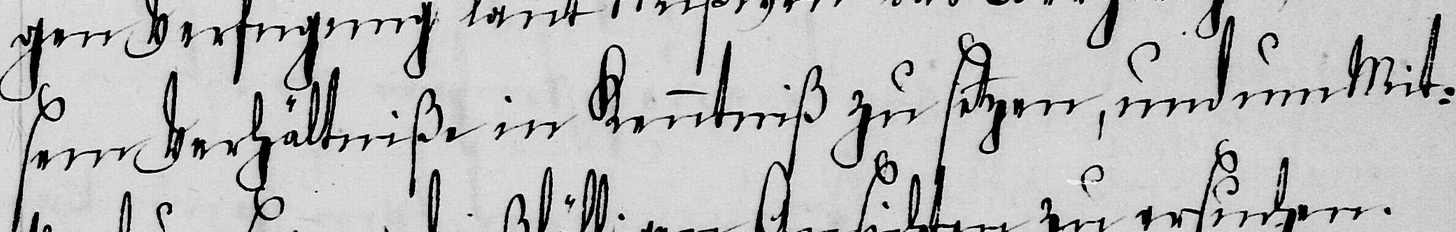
sem Verhältniße in Kenntniß zu setzen, und um Mit¬
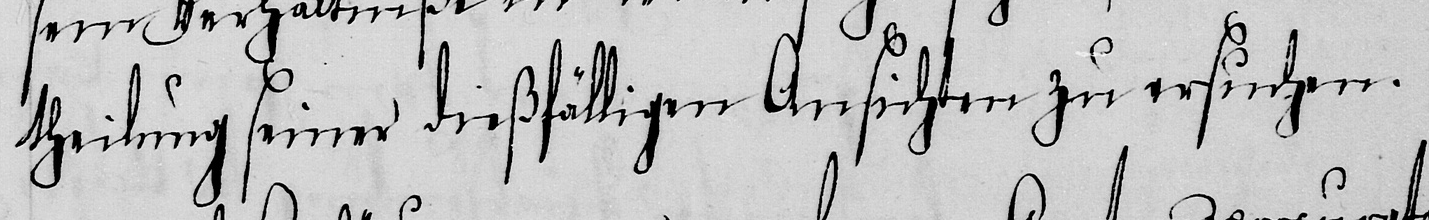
theilung seiner dießfälligen Ansichten zu ersuchen.
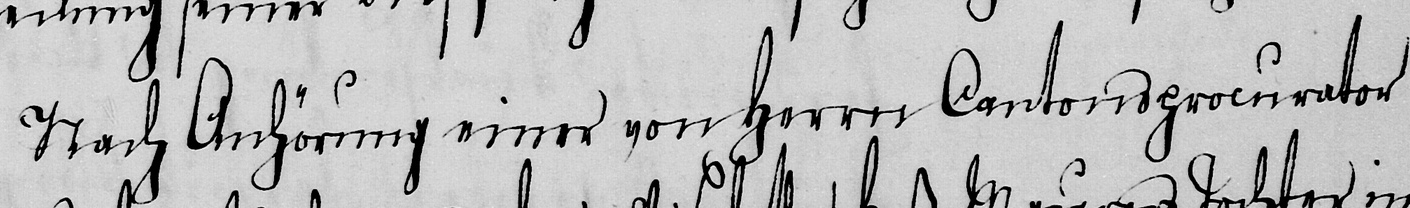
Nach Anhörung einer von Herrn Cantonsprocurator
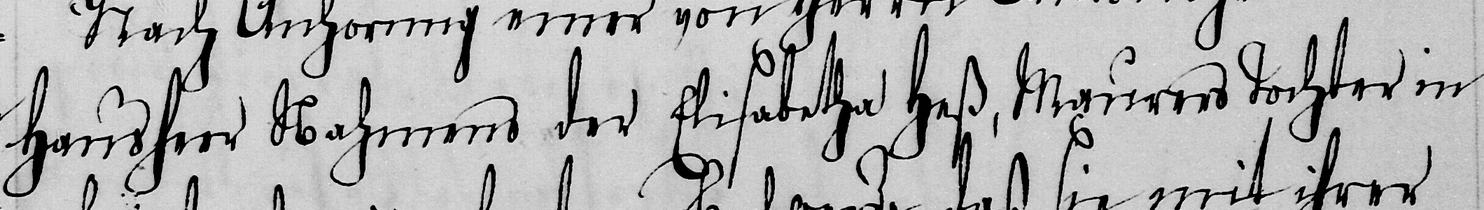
Hausheer Nahmens der Elisabetha Heß, Maurers Tochter in
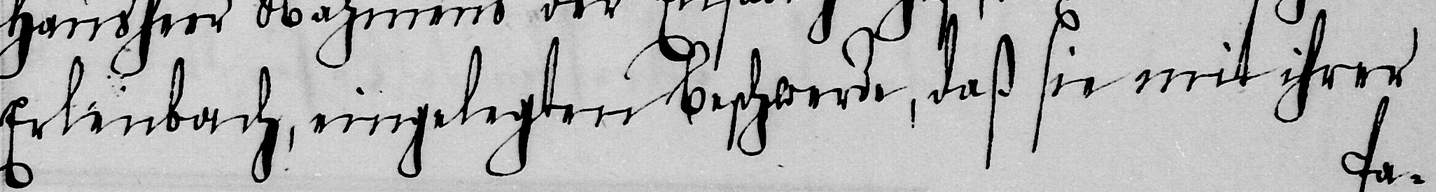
Erlenbach, eingelegten Beschwerde, daß sie mit ihrer
